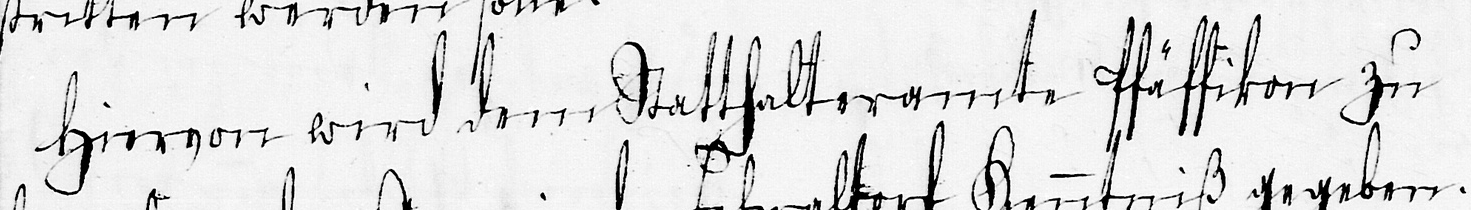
Hiervon wird dem Statthalteramte Pfäffikon zu
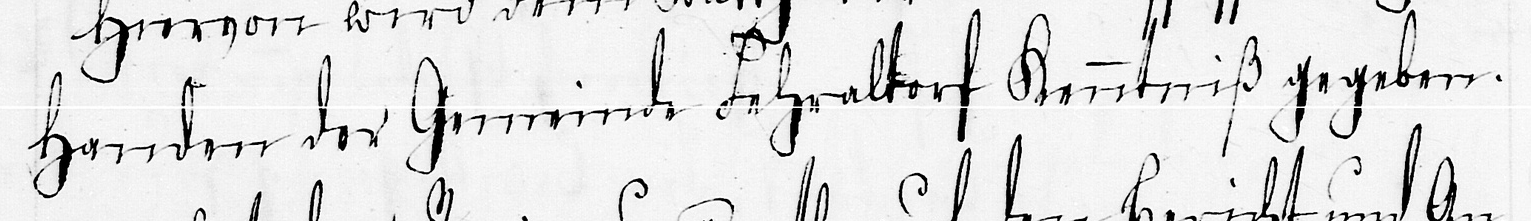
Handen der Gemeinde Fehraltorf Kenntniß gegeben.
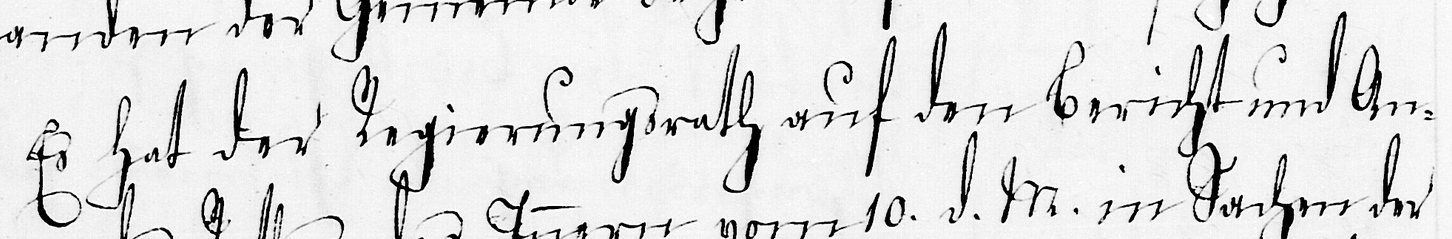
Es hat der Regierungsrath auf den Bericht und An¬
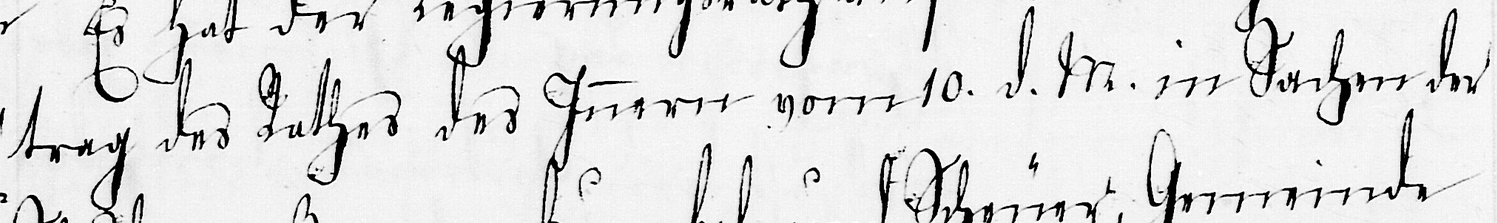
trag des Rathes des Innern vom 10. d. M. in Sachen der
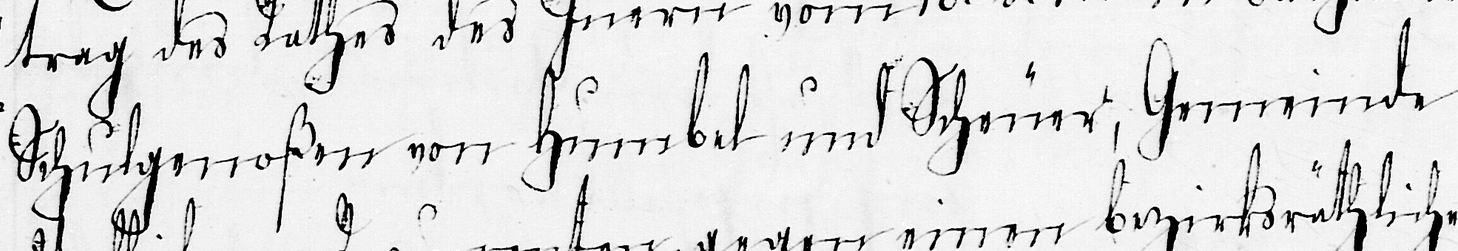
Schulgenoßen von Humbel und Scheuer, Gemeinde
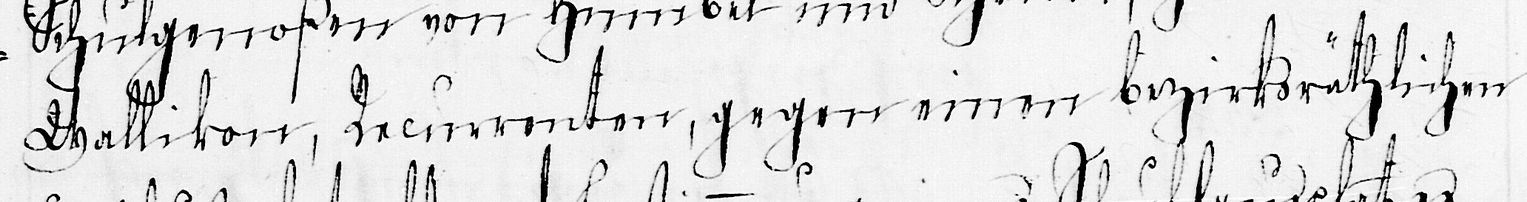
Wallikon, Recurrenten, gegen einen bezirksräthlichen
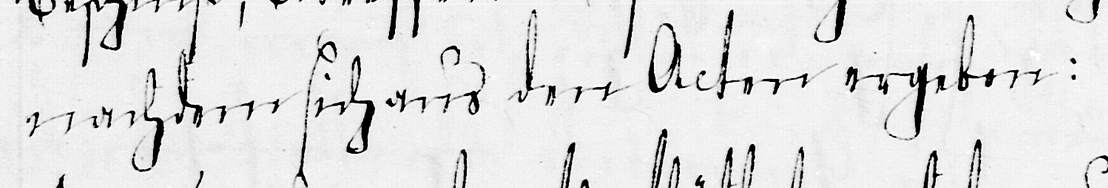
nachdem sich aus den Acten ergeben:
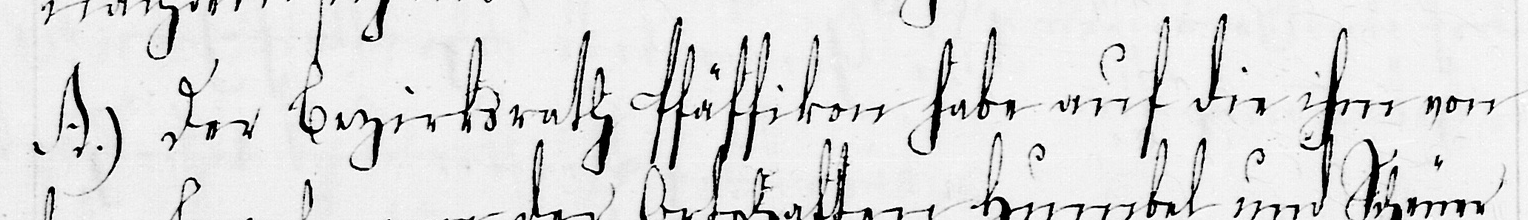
A.) Der Bezirksrath Pfäffikon habe auf die ihm von
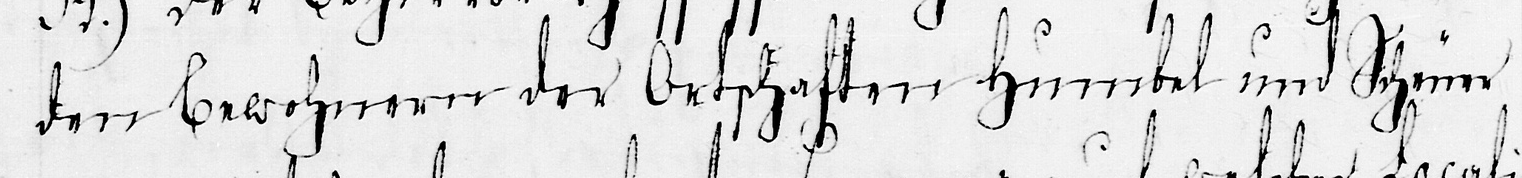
den Bewohnern der Ortschaften Humbel und Scheuer
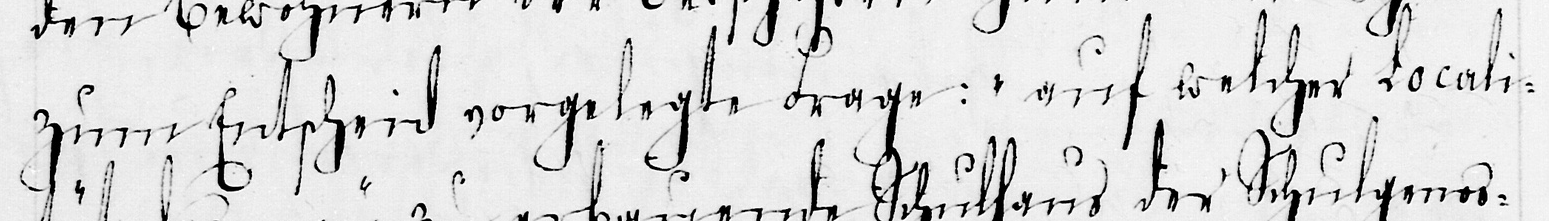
zum Entscheid vorgelegte Frage: „auf welcher Locali¬
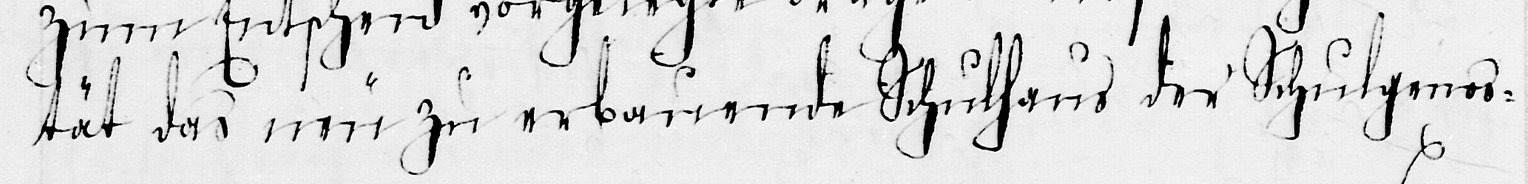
tät das neu zu erbauende Schulhaus der Schulgenos-
